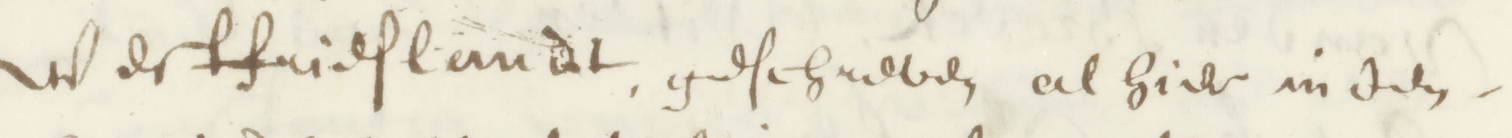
Westfrieslandt, geschreven alhier inden
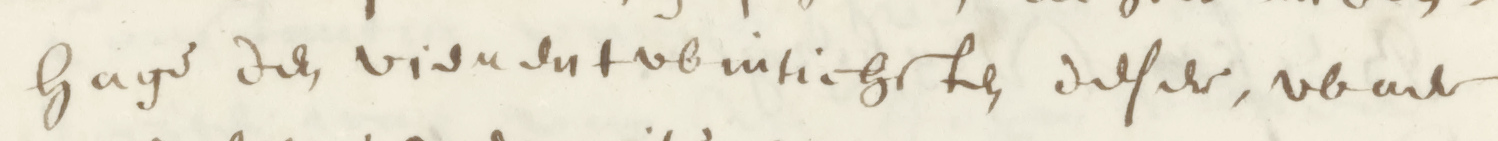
hage den vierentwintichsten deser, waer
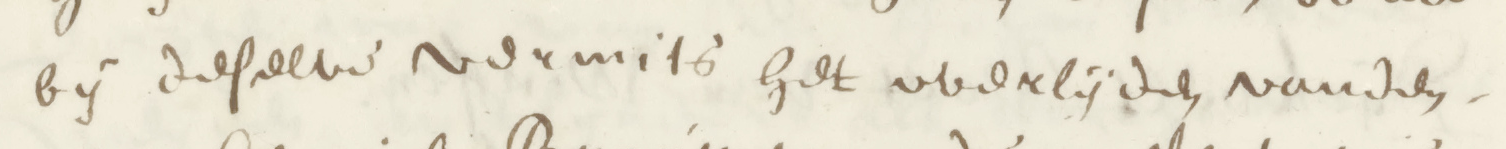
bij deselve vermits het overlijden vanden
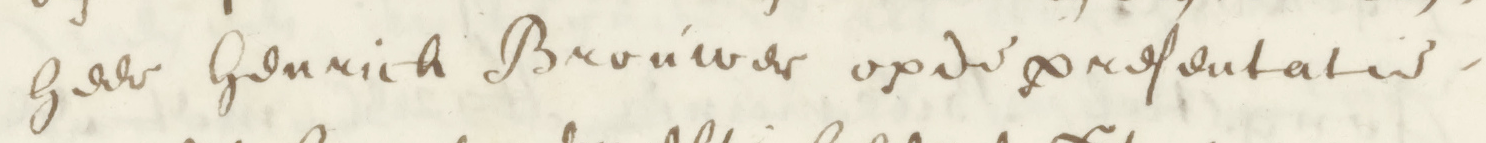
heer henrick Brouwer opde presentatie
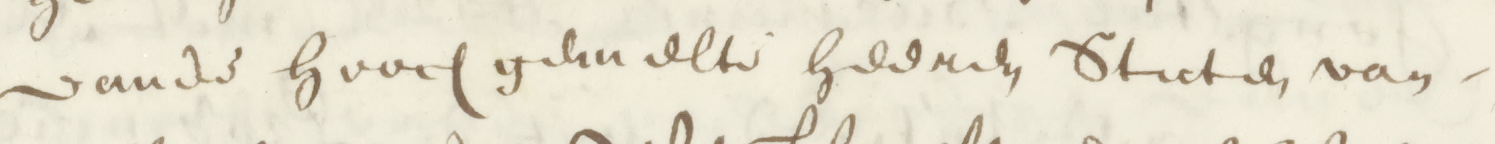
vande hoochgemelte heeren Staten van
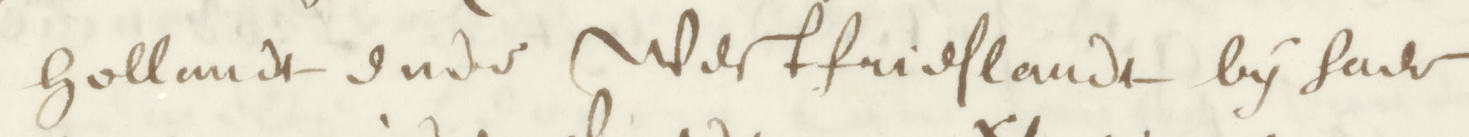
hollandt ende Westfrieslandt bij haer
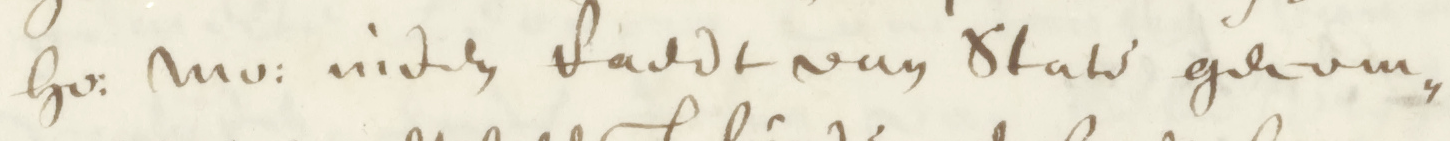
ho:mo: inden Raedt van State gecom„
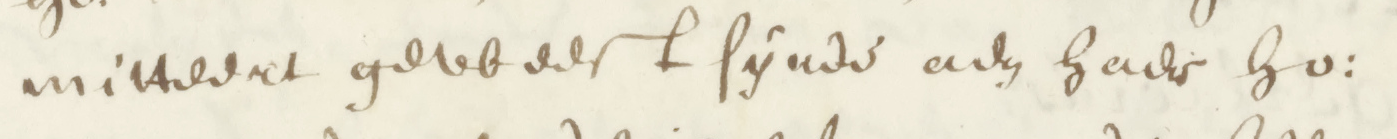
mitteert geweest sijnde aen haer ho:
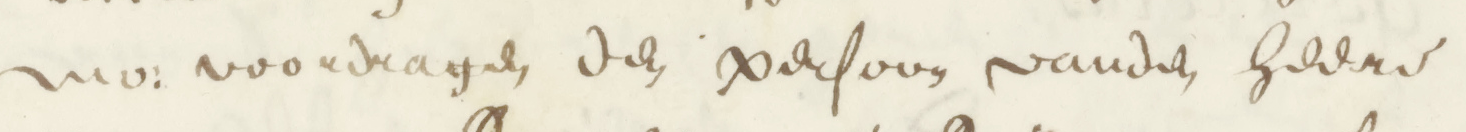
mo: voordragen den persoon vanden heere
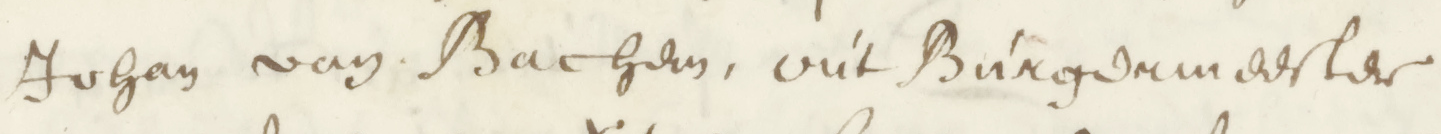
Johan van Bachem, out Burgermeester
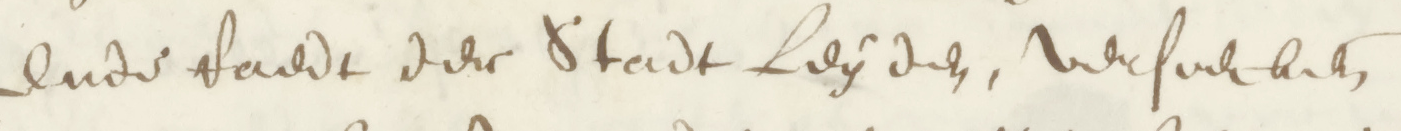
ende Raedt der Stadt Leijden, versoecken
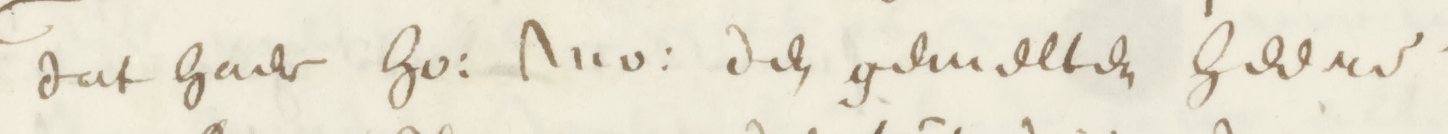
dat haer ho:mo: den gemelten heere
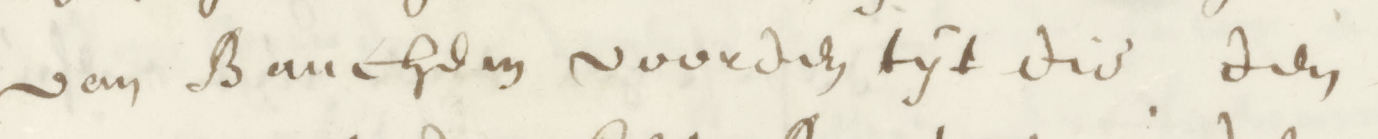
van Banchem voorden tijt die den
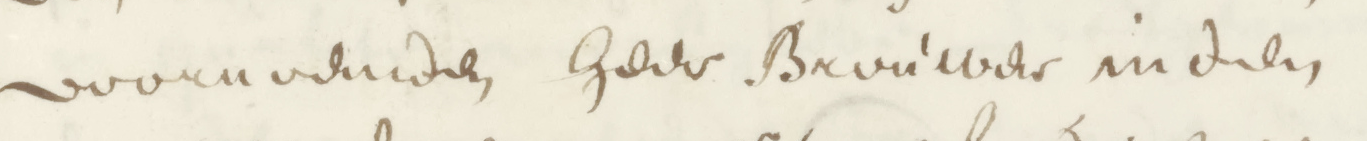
voornoemden heer Brouwer inden
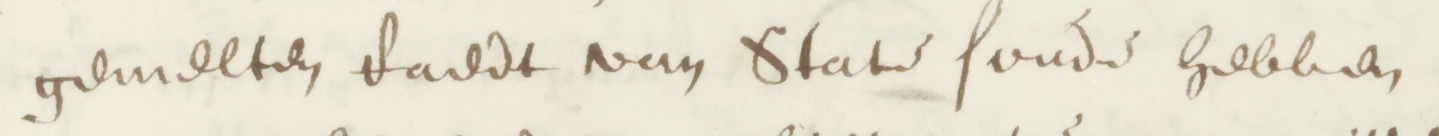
gemelten Raedt van State soude hebben
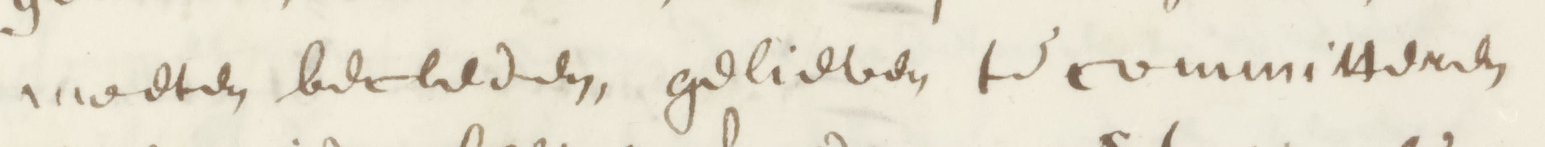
moeten becleden, gelieven te committeren
